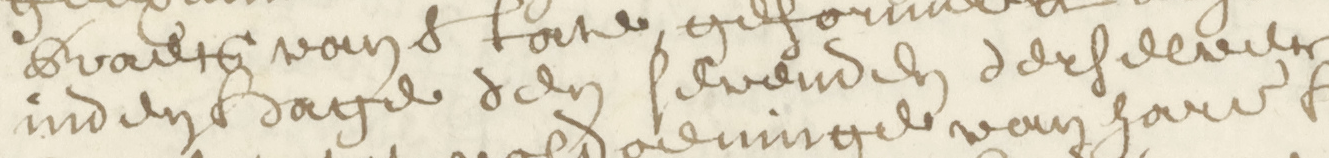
inden Hage den sevenden derselver
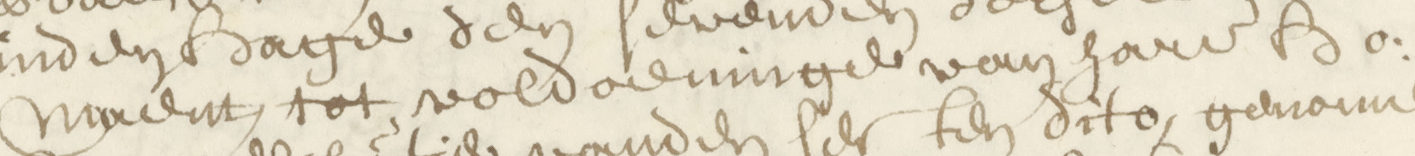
maent, tot voldoeninge van hare Ho:
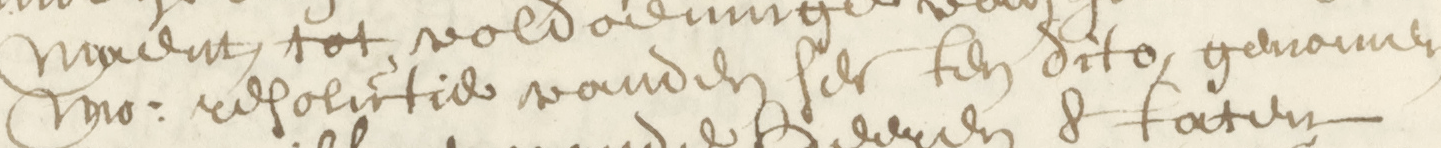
Mo: resolutie vanden sesten dito, genomen
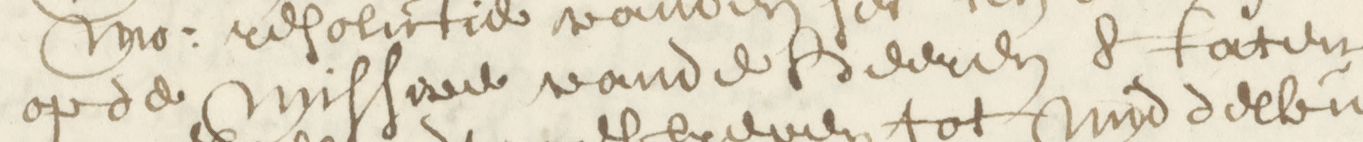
opde Missive vande Heeren Staten
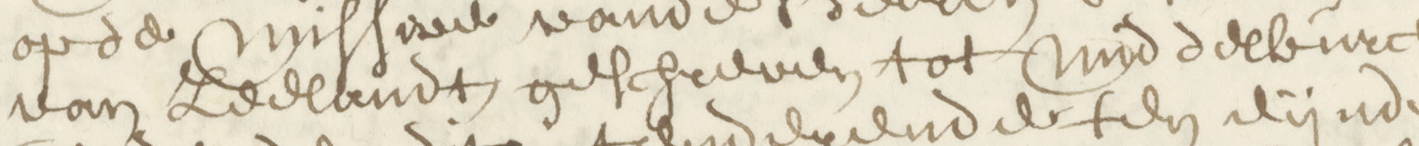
van Zeelandt, geschreven tot Middelburch
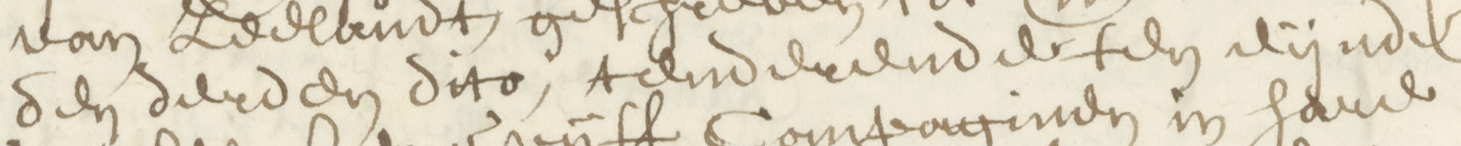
den derden dito, tenderende ten eijnde
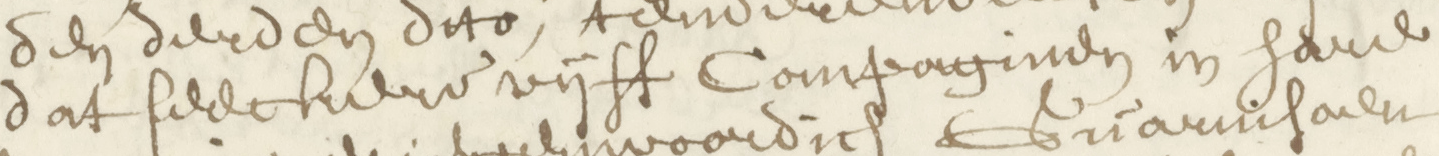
dat seeckere vijff Compagnien in hare
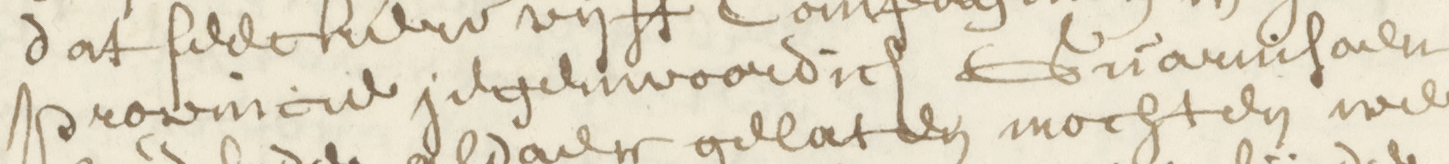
Provincie jegenwoordich Guarnisoen
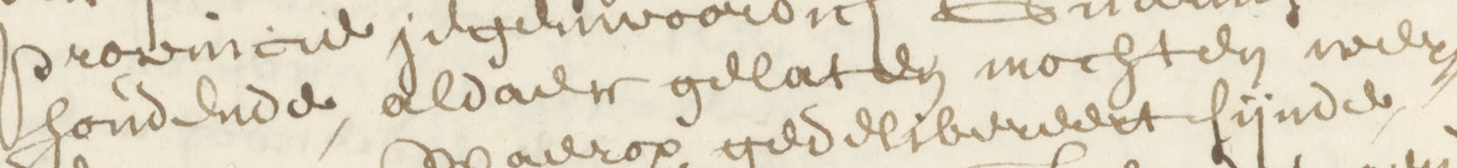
houdende, aldaer gelaten mochten wer„
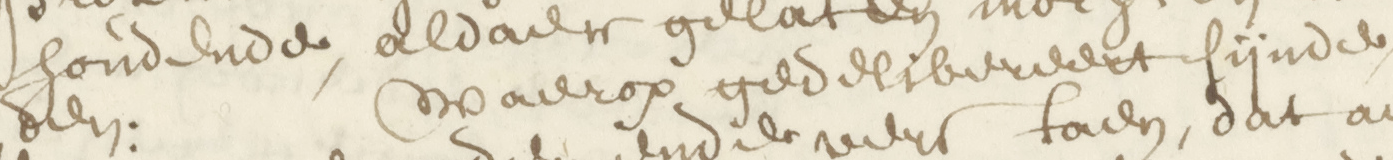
den: Waerop gedelibereert sijnde
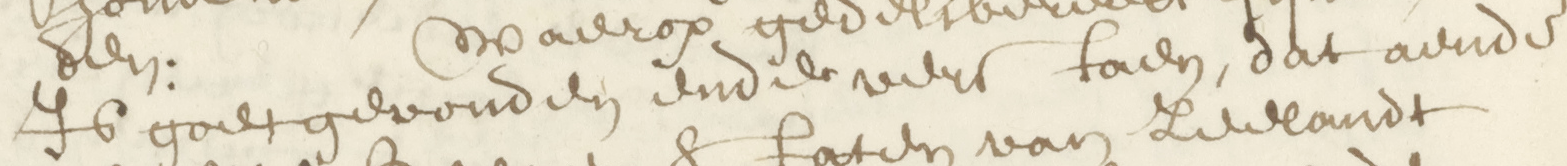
Is goetgevonden ende verstaen, dat aende
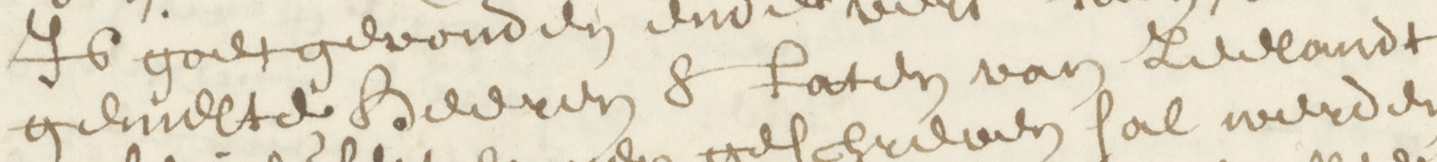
gemelte Heeren Staten van Zeelandt
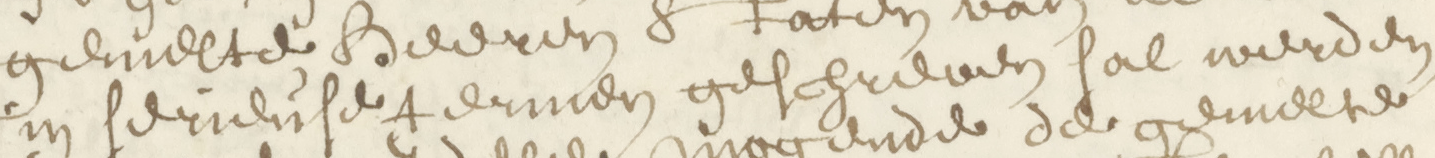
in serieuse termen geschreven sal werden,
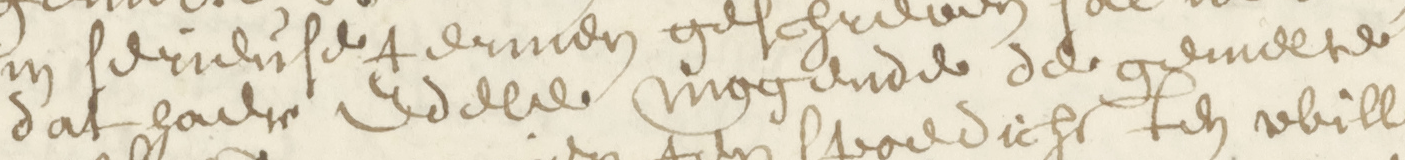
dat haer Edele mogende de gemelte
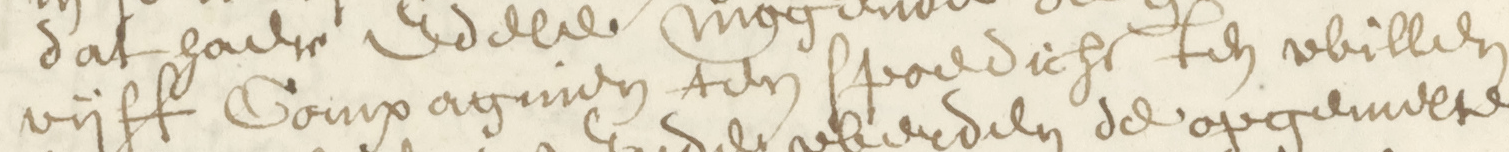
vijff Compagnien ten spoedichsten willen
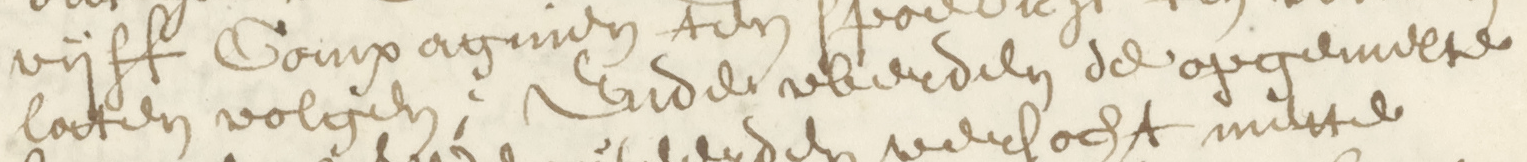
laten volgen; Ende werden de opgemelte
